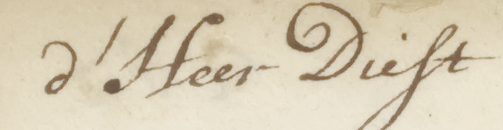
d'Heer Diest
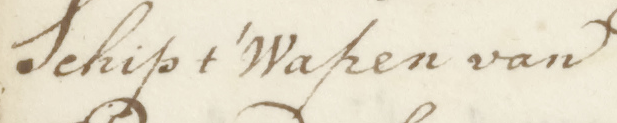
Schip t'Wapen van
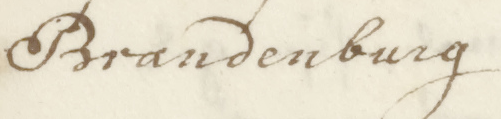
Brandenburg
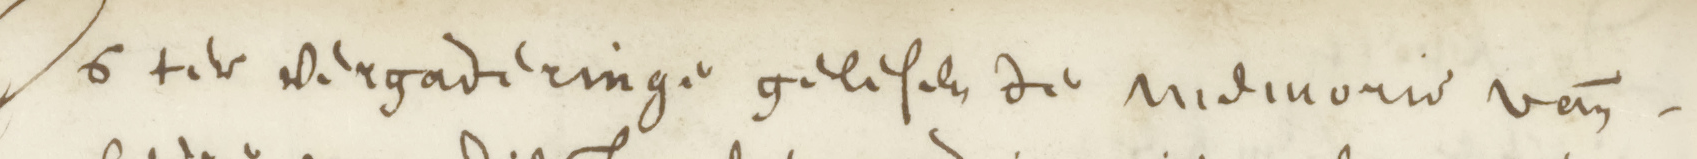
Is ter Vergaderinge gelesen de memorie van
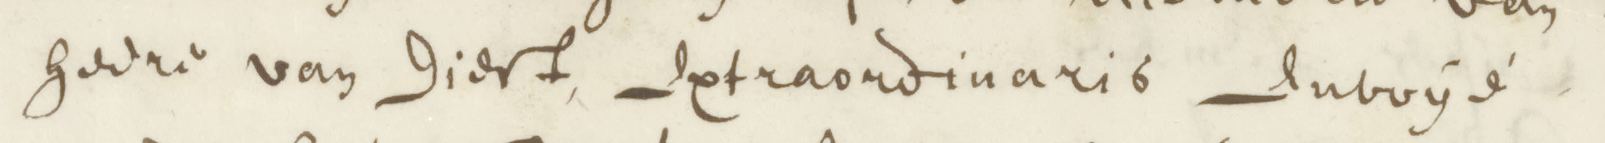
heere van Diest, Extraordinaris Envoijé
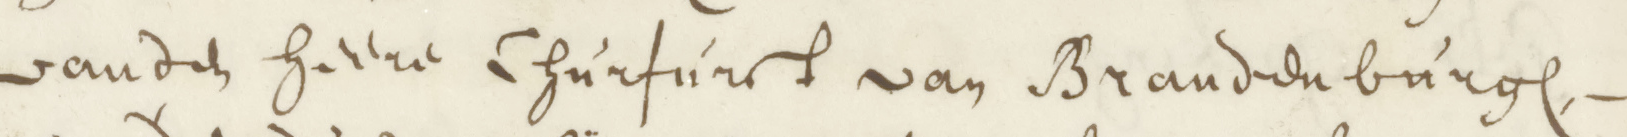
vanden heere Churfurst van Brandenburgh,
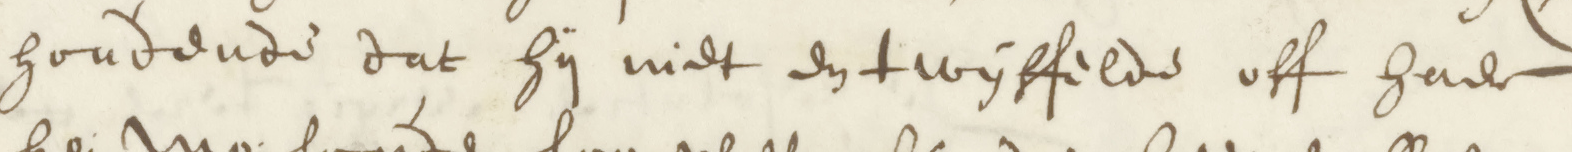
houdende dat hij niet en twijffelde off haer
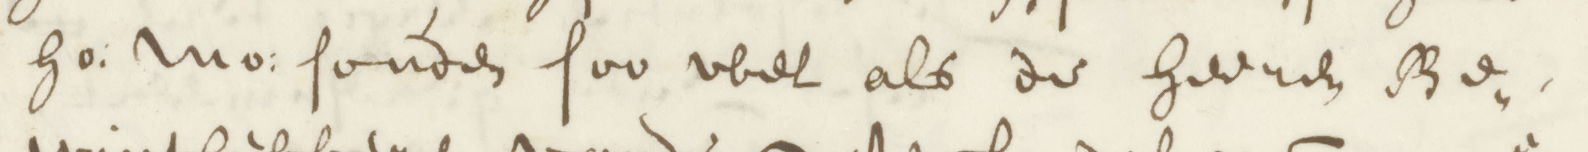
ho:Mo: souden soo wel als de heeren Be„
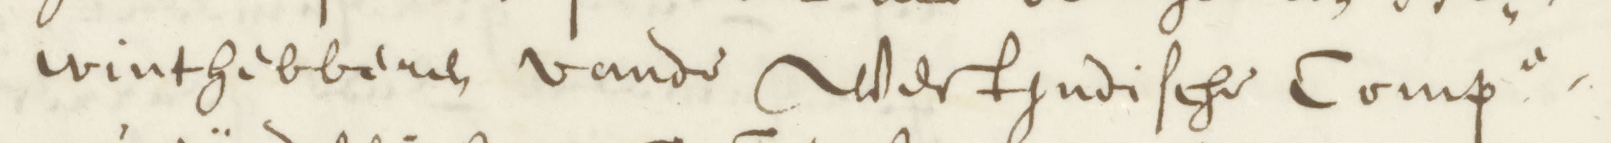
winthebberen vande Westindische Compe.
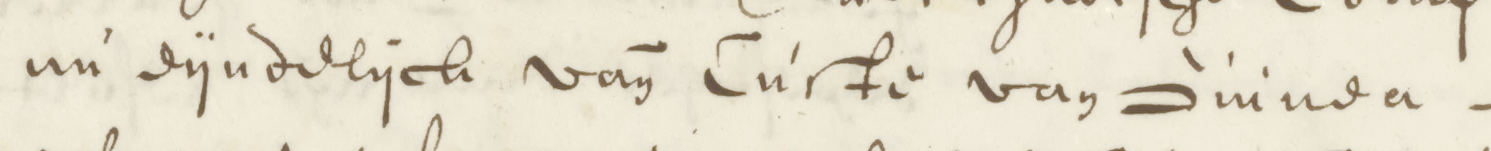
nu eijndelijck van Custe van Guinea
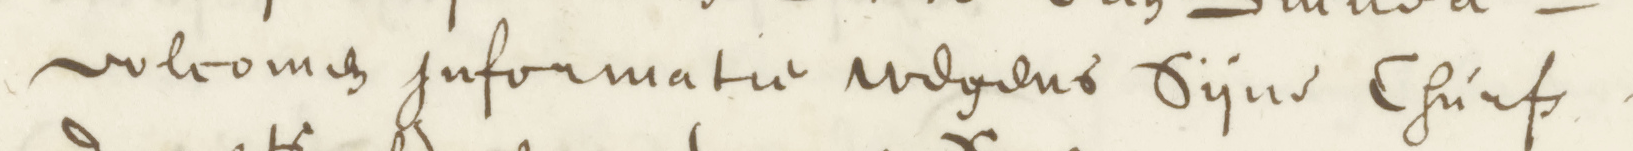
volcomen informatie wegens Sijne Churf.
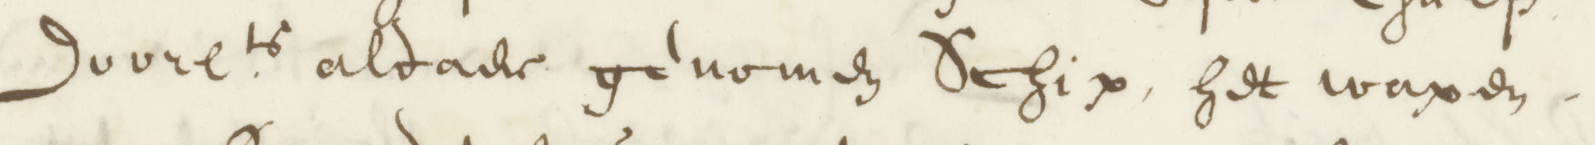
Doorlts. aldaer genomen Schip, het wapen
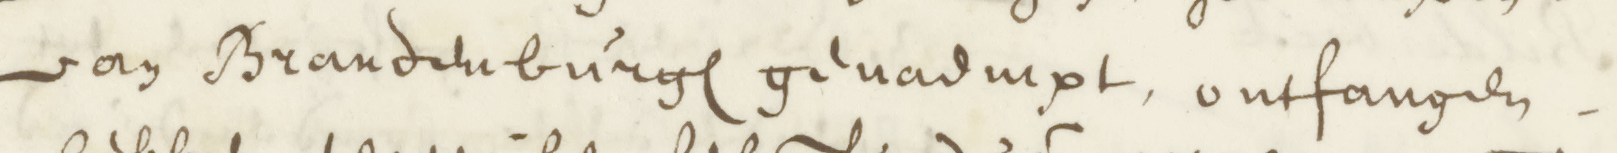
van Brandenburgh genaempt, ontfangen
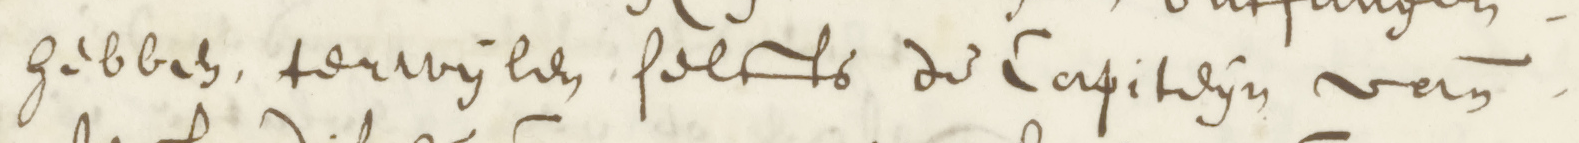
hebben, terwijlen selffs de Capiteijn van
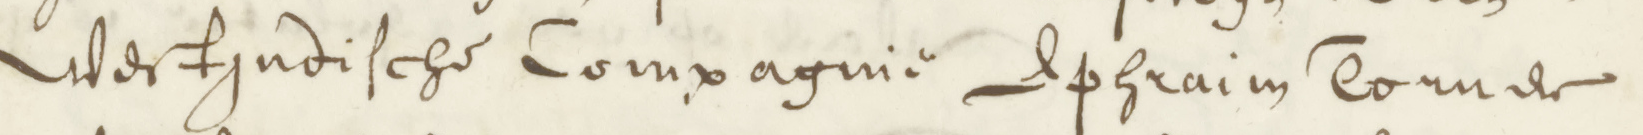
Westindische Compagnie Ephraim Torner
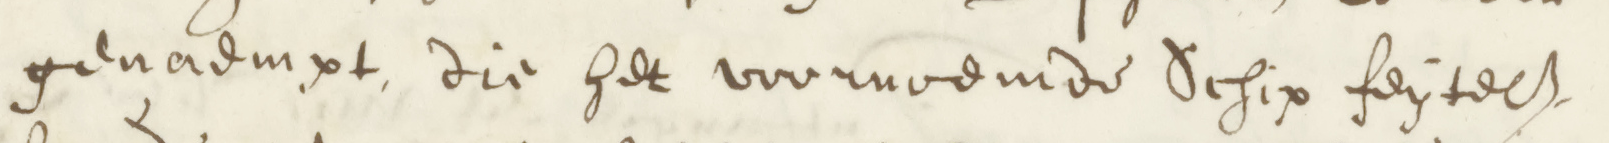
genaempt, die het voornoemde Schip feijtel.
